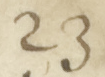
23
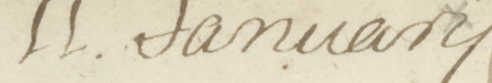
11. Januarij
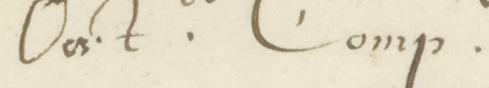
Oost de Compe.
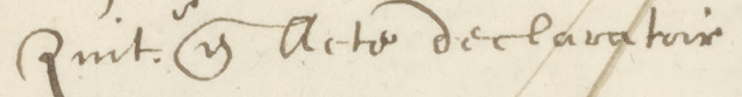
Quite. & Acte declaratoir
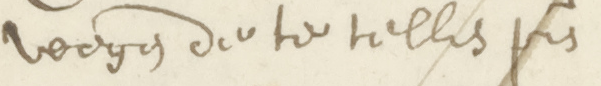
wegen de te tellen pn
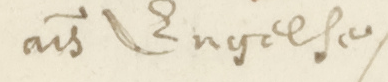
aen Engelsche.
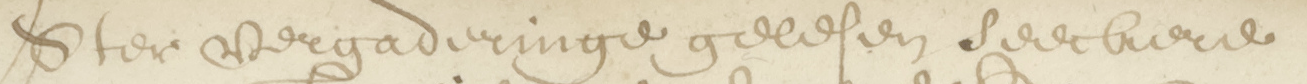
Is ter vergaderinge gelesen seeckere
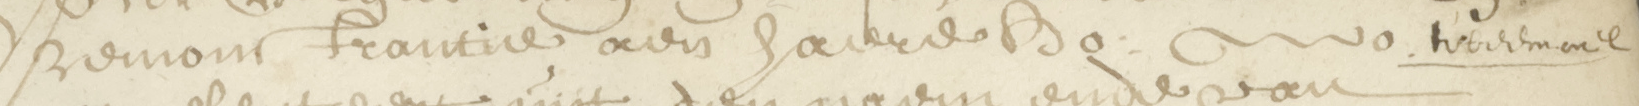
remonstrantie aen Haere Ho:Mo: tweemael
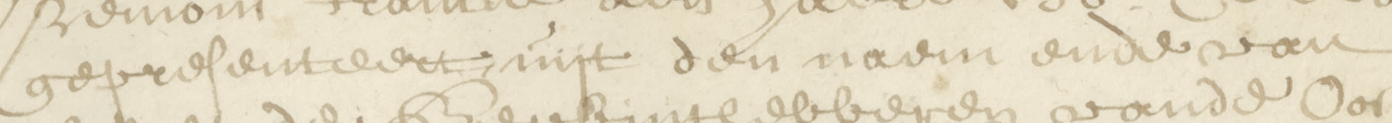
gepresenteert, uijt den naem ende van
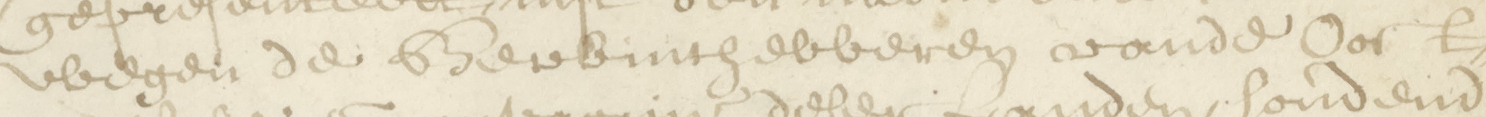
wegen de Bewinthebberen vande Oost„
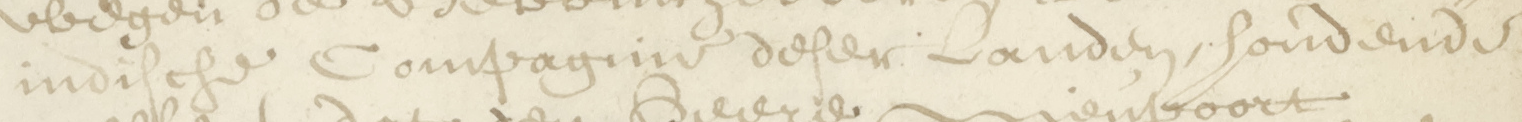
indische Compagnije deser Landen, houdende
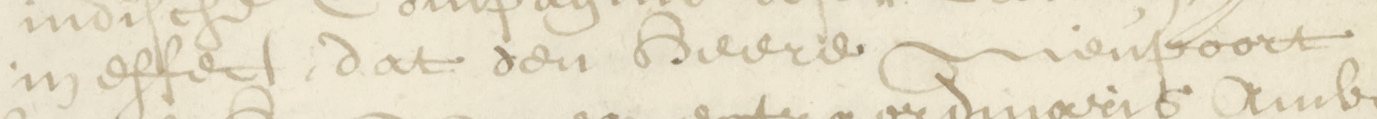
in effect, dat den heere Monfoort
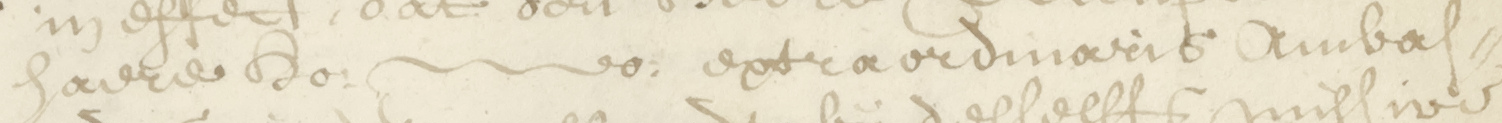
haere Ho:Mo: extra ordinaris Ambas„
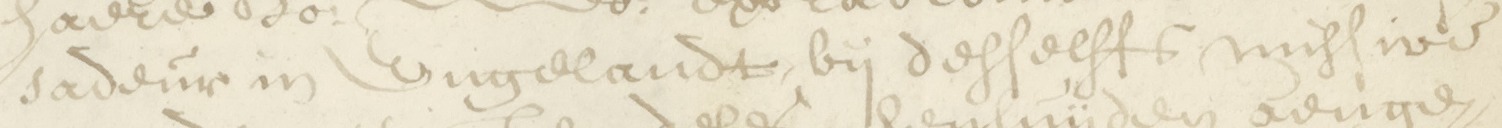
sadeur in Engelandt bij desselffs missive
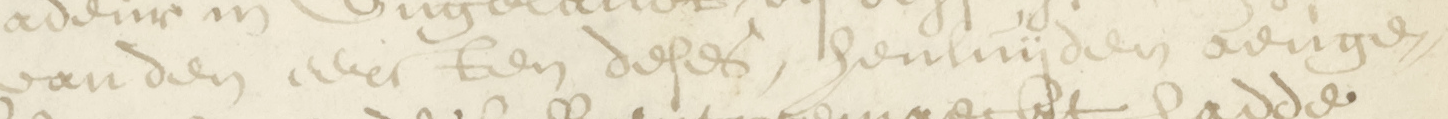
van den eersten deses, henluijden aenge„
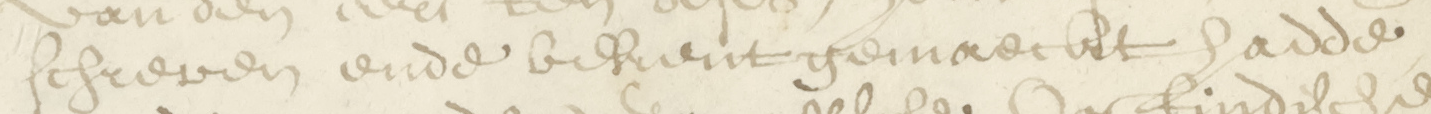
schreven ende bekent gemaeckt hadde
